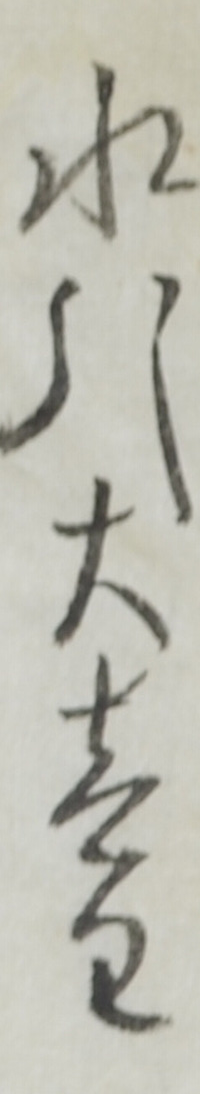水引大壱わ
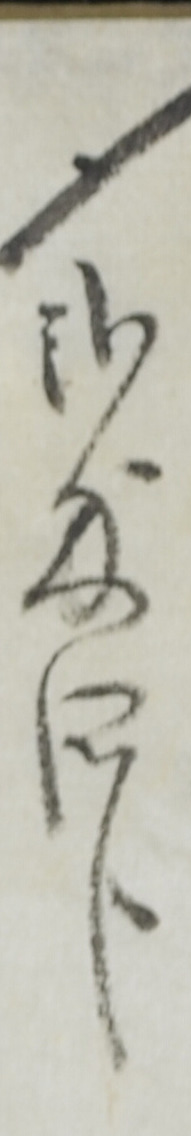〆弐匁四分
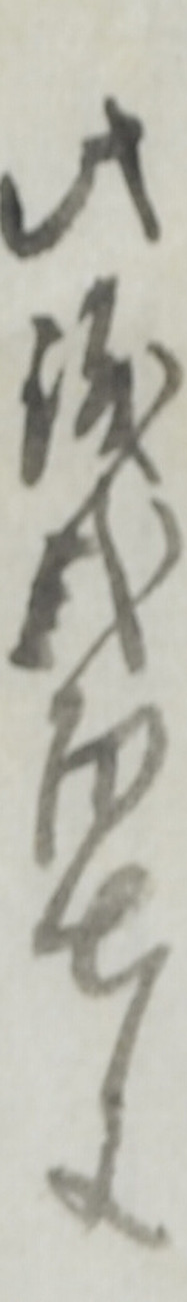此銭弐百七文
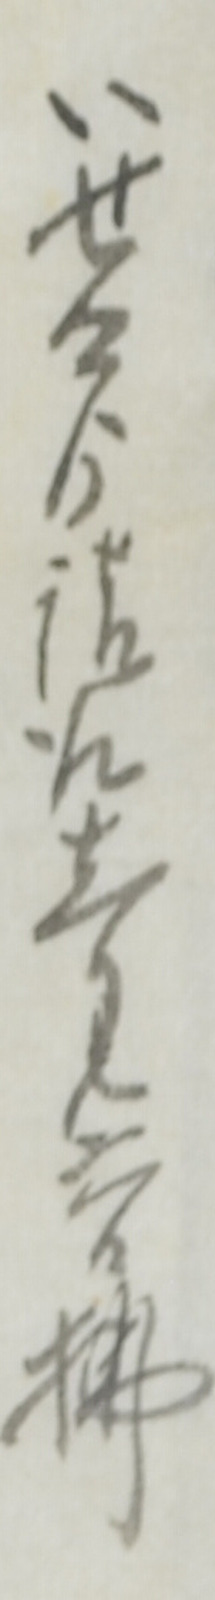いせ屋ゟ請取十一月六日払
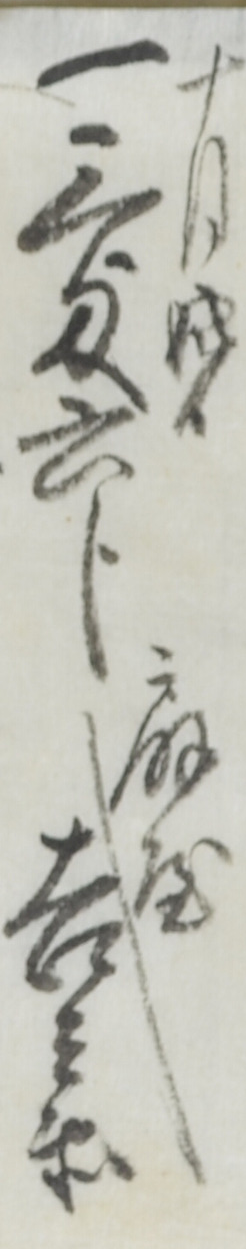一三匁六分吉兵衛
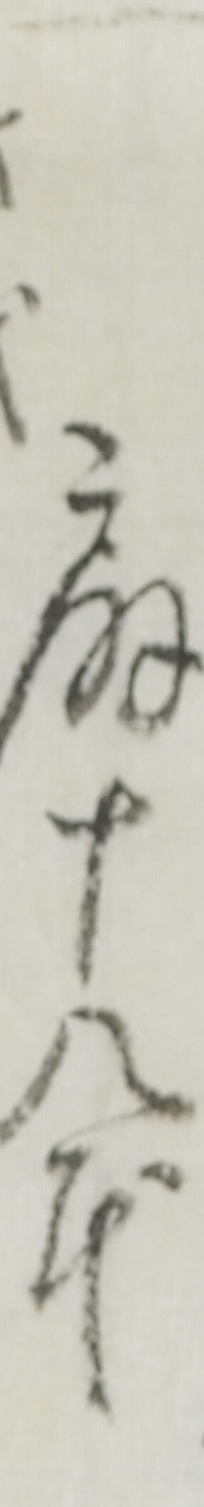扇十八本
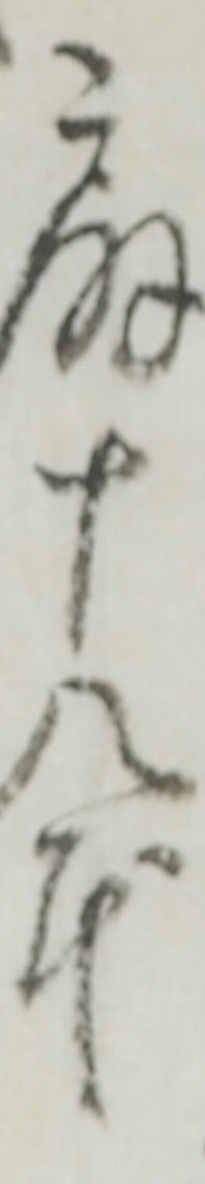扇十八本
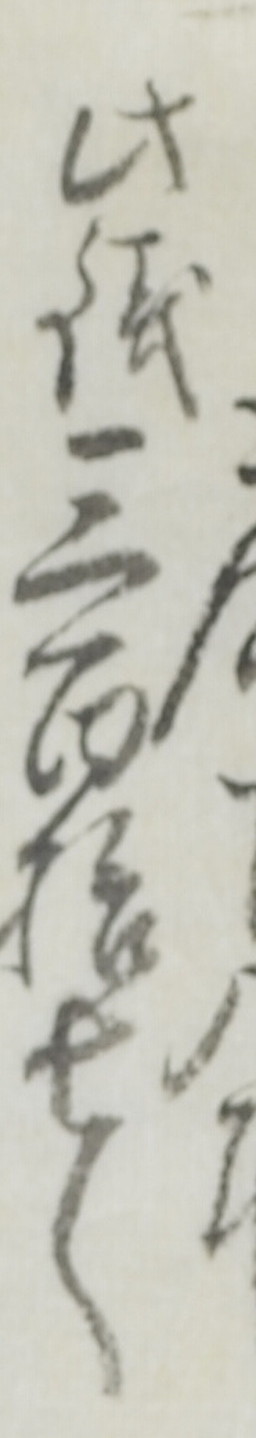此銭三百拾七文
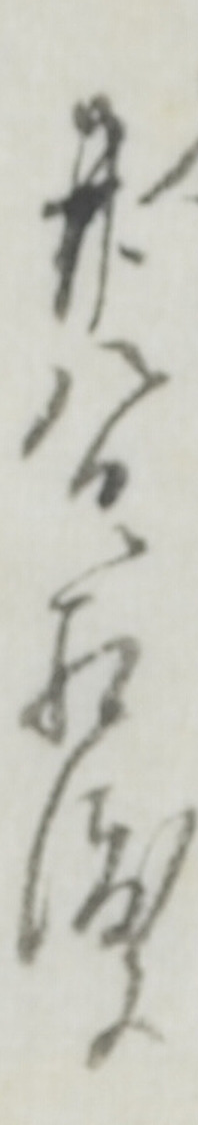廿八日ニ相渡ス
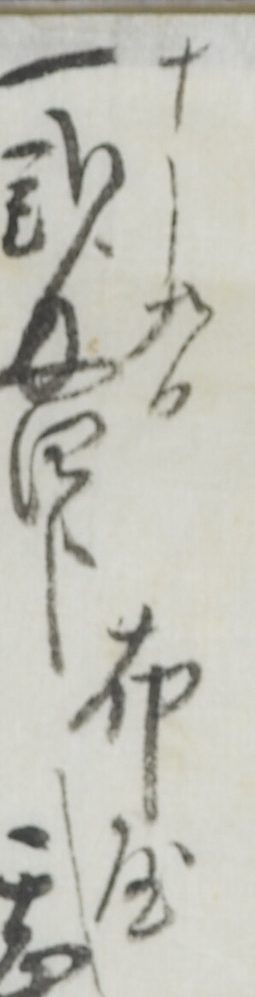一弐匁四分甚四郎
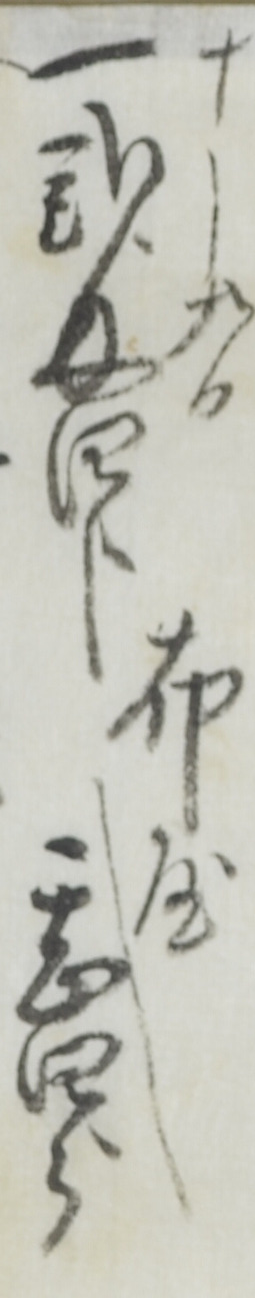一弐匁四分甚四郎
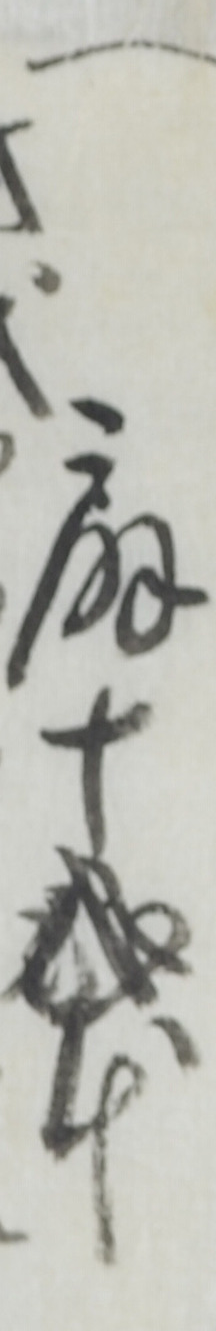扇十八本
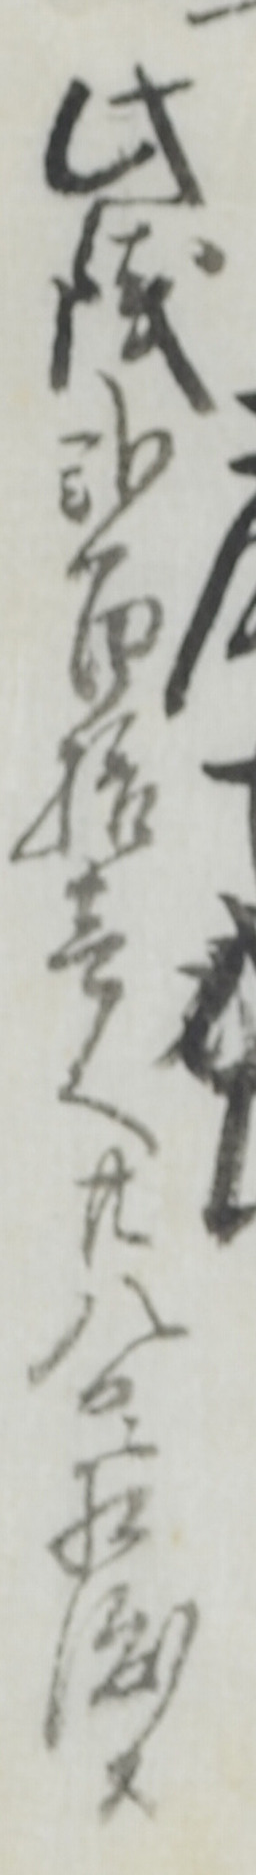此銭弐百拾壱文廿八日ニ相渡ス
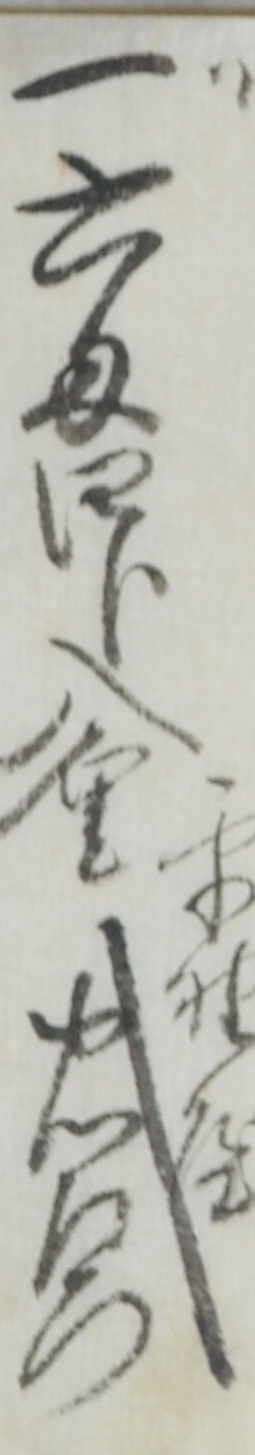一六匁四分八厘忠左衛門
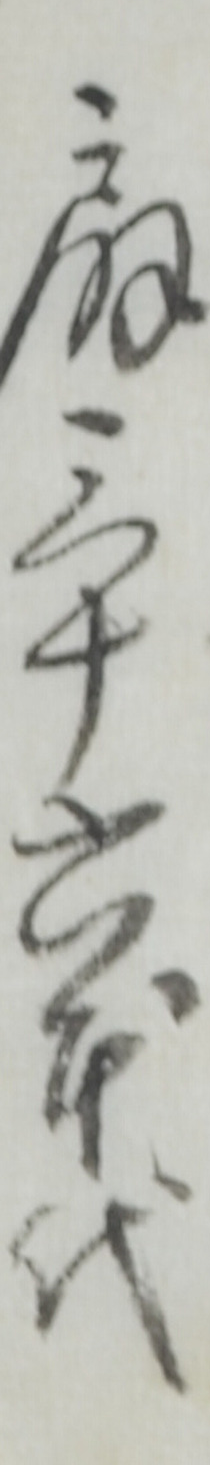扇三十六本代
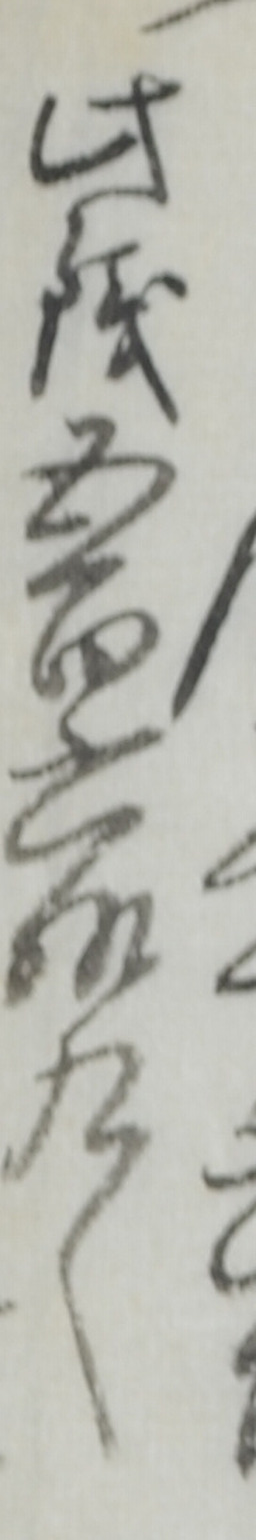此銭五百六拾九文
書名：権現勧化入用勘定帳
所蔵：伊那市立高遠町図書館・合同会社AMANE
